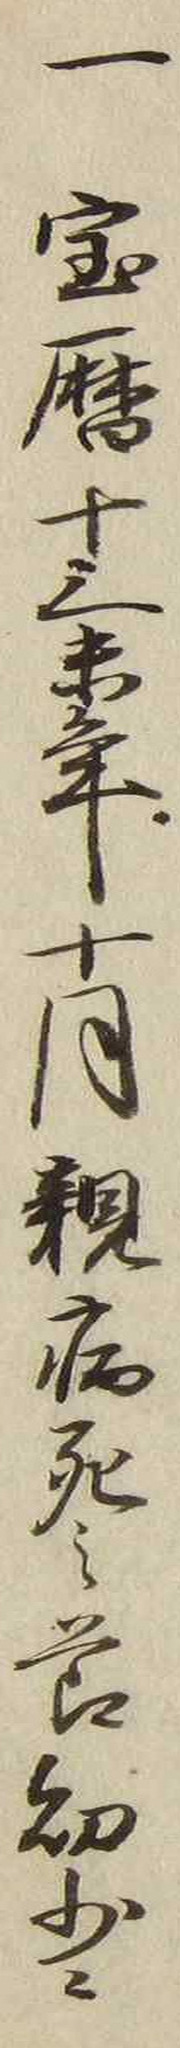一宝暦十三未年十月親病死之節幼少ニ

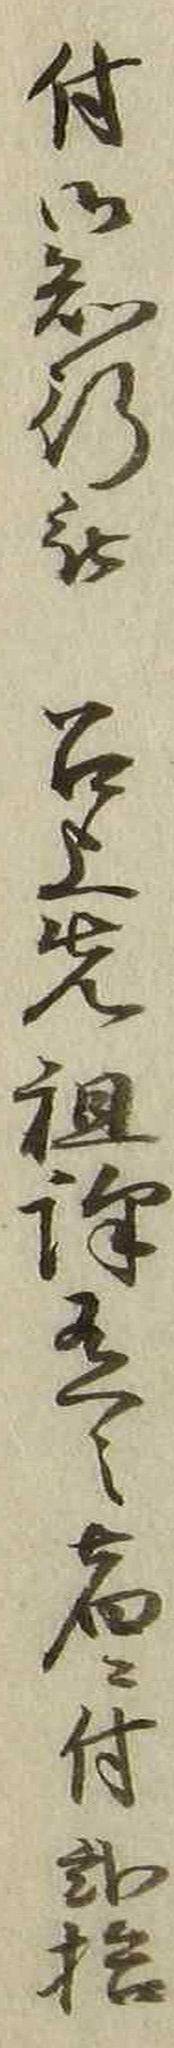付御知行被召上先祖訳有之者ニ付弐拾
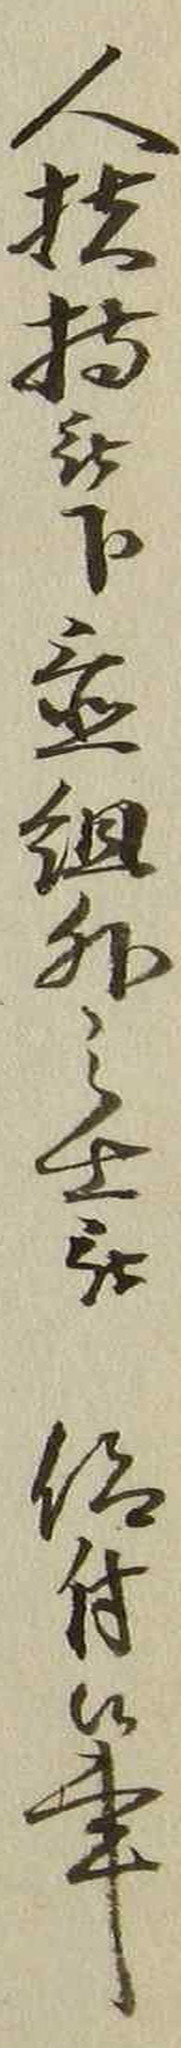人扶持被下置組外之士被仰付候事
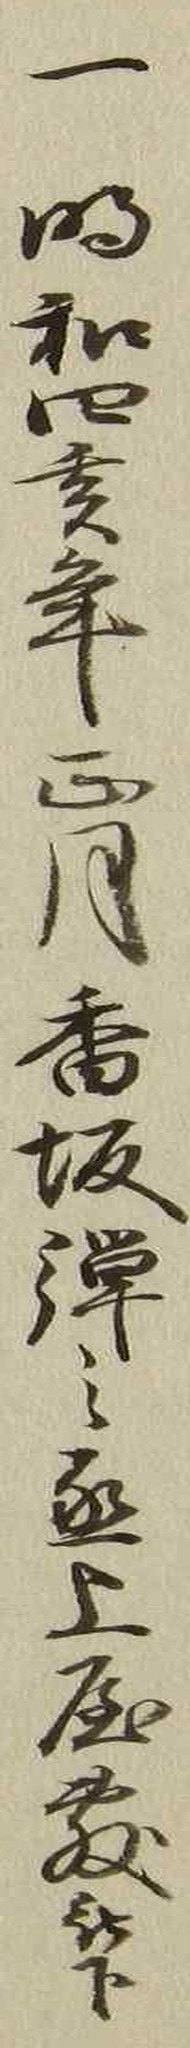一明和四亥年正月香坂弾之丞上屋敷被下
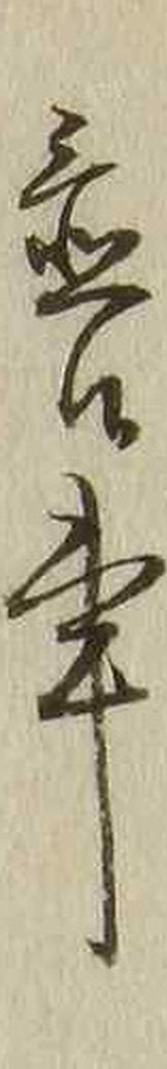置候事
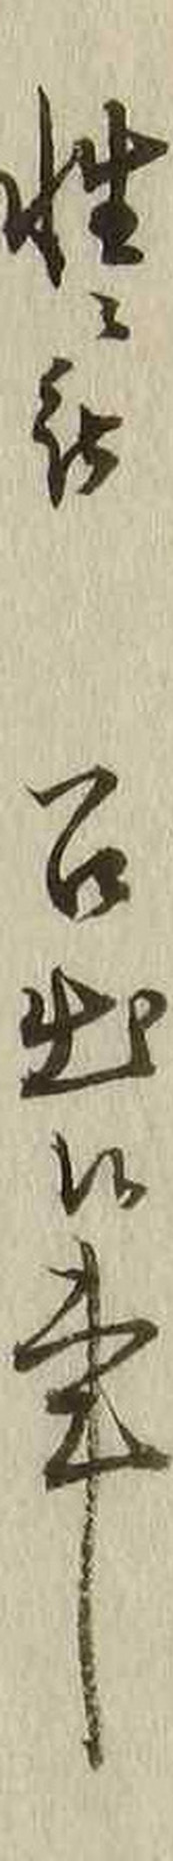姓ニ被召出候事
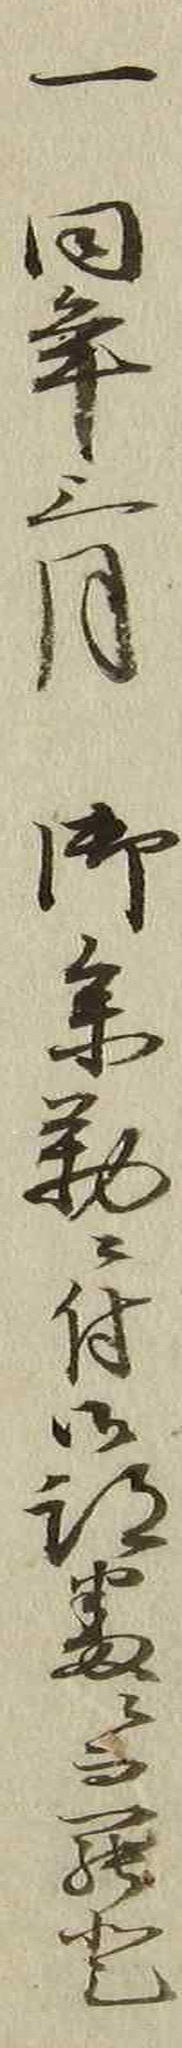一同年三月御参勤ニ付御跡番ニ而罷登
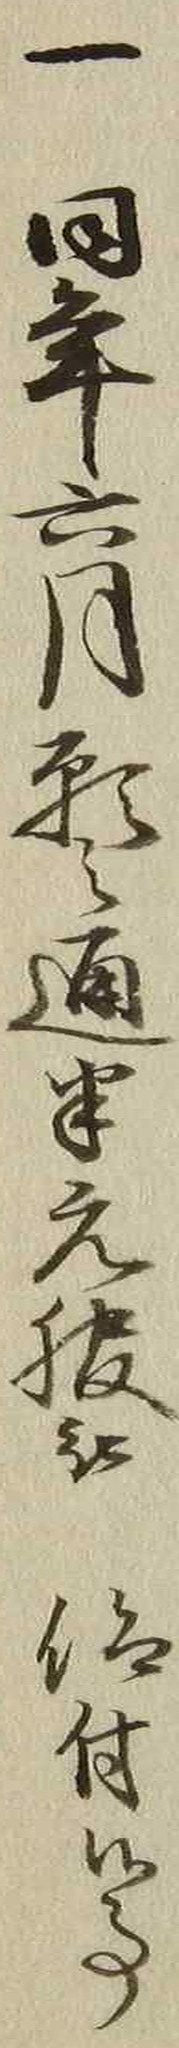一同年六月願之通半元服被仰付候事
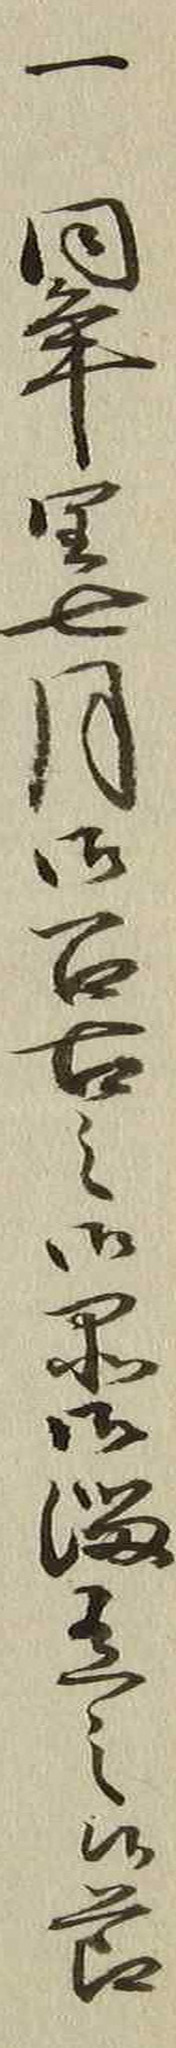一同年閏七月御召古之御品御溜有之候節
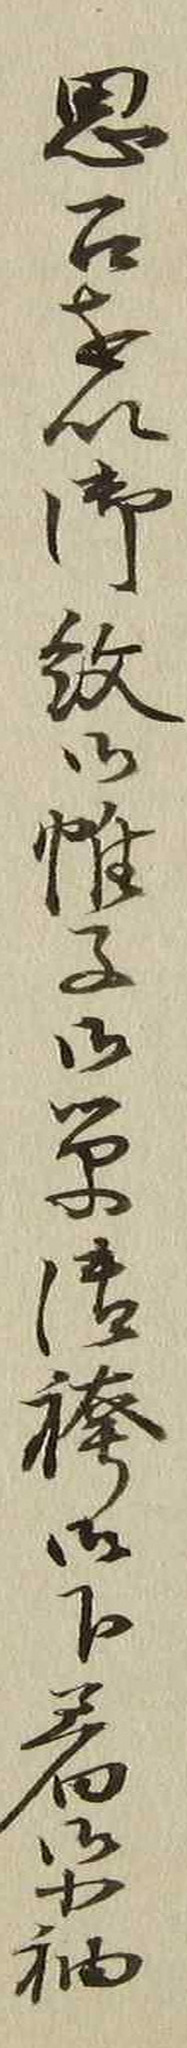思召を以御紋御帷子御単御袴御下着御小袖
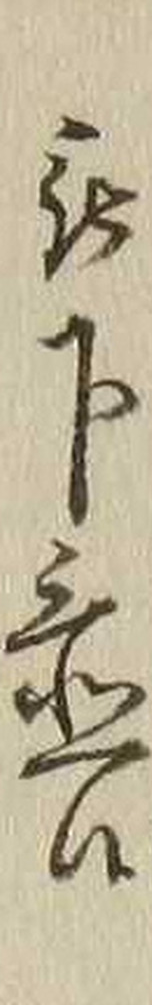被下置候
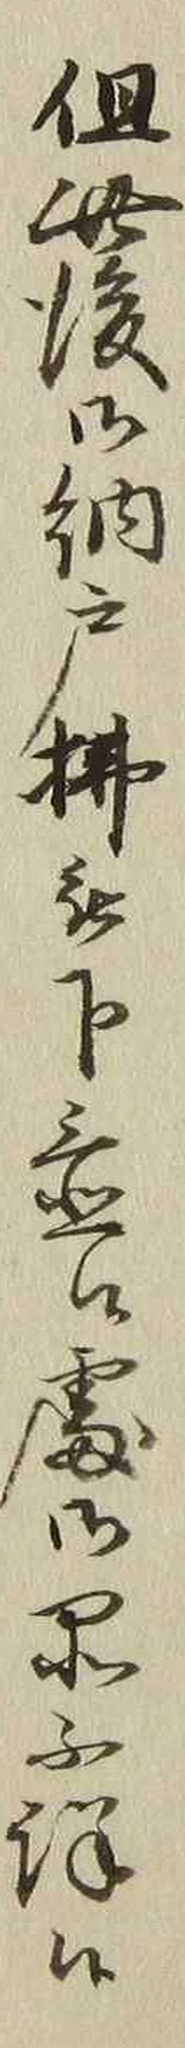但此後御納戸払被下置候處御品ふ詳候
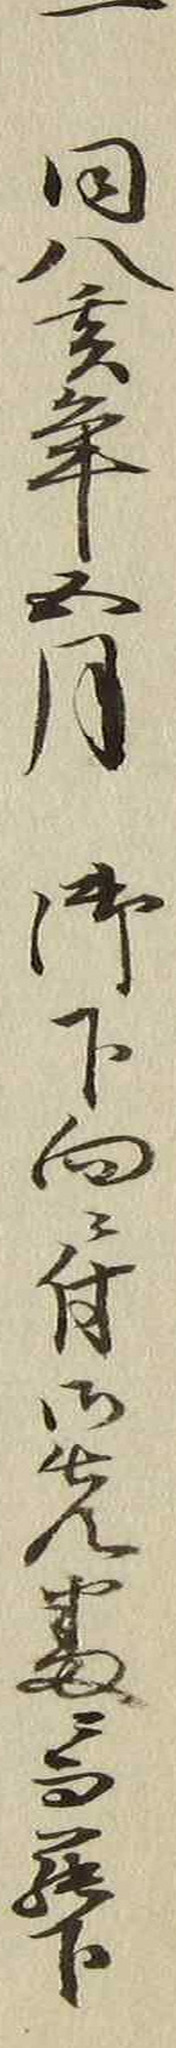一同八亥年五月御下向ニ付御先番ニ而罷下
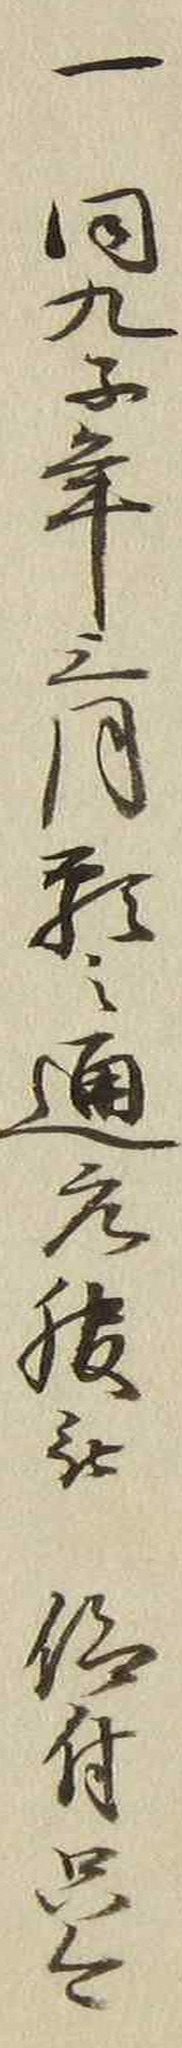一同九子年三月願之通元服被仰付只今
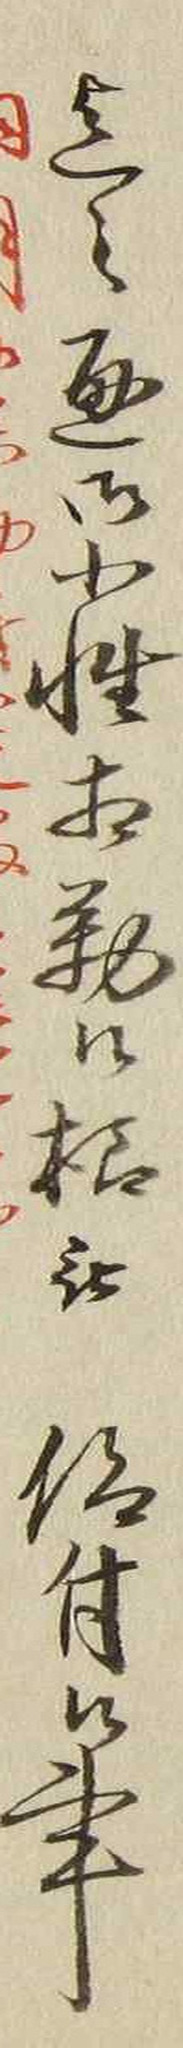迄之通御小姓相勤候様被仰付候事
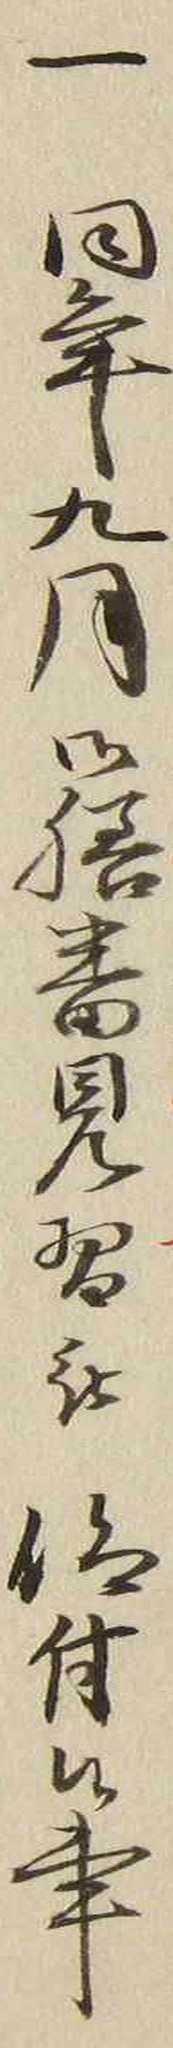一同年九月御膳番見習被仰付候事
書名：諸士系譜　巻之114　か之部22
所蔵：会津若松市立会津図書館
